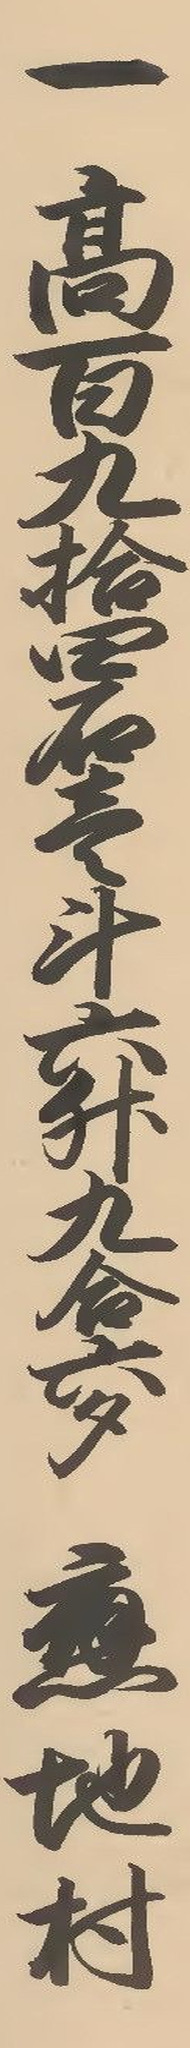一高百九拾四石壱斗六升九合六勺応地村
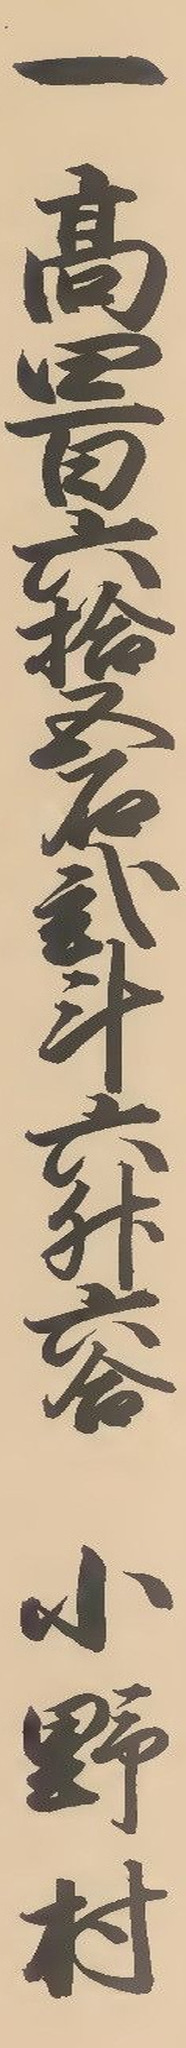一高四百六拾五石弐斗六升六合小野村
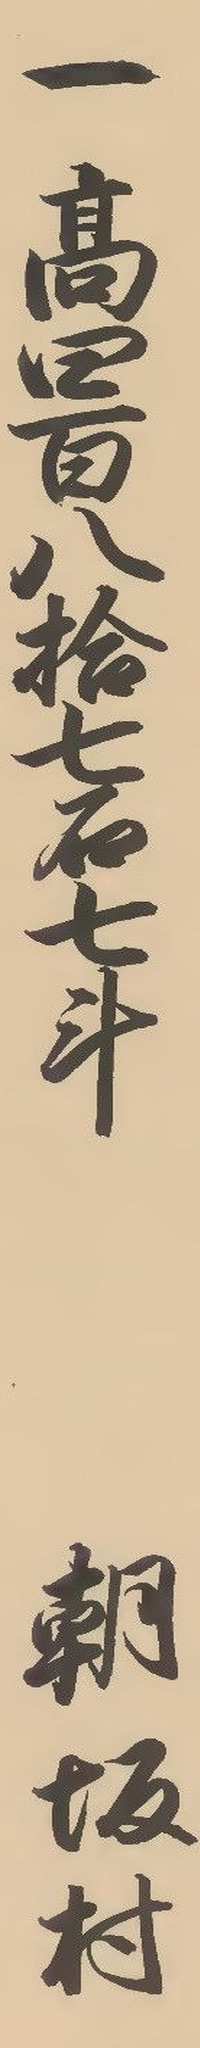一高四百八拾七石七斗朝坂村
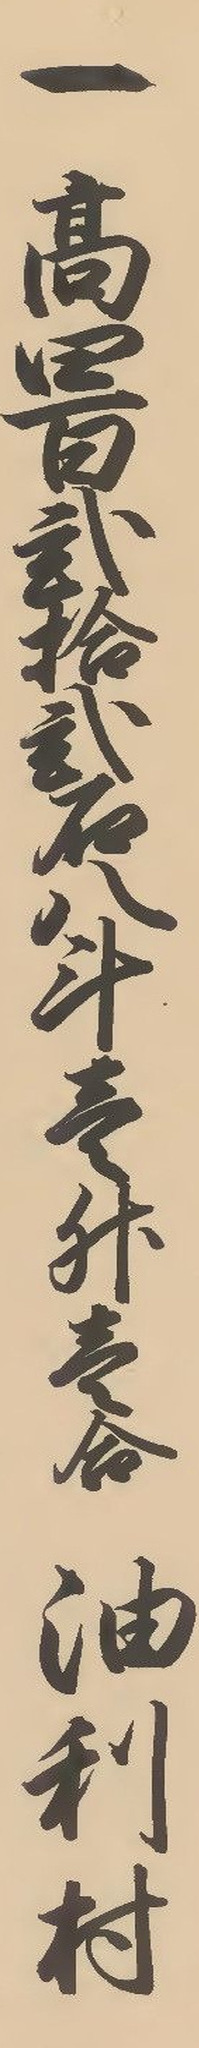一高四百弐拾弐石八斗壱升壱合油利村
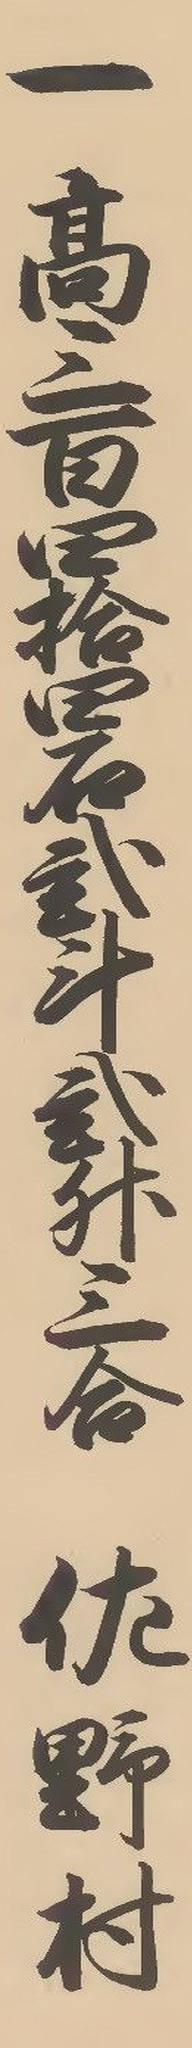一高三百四拾四石弐斗弐升三合佐野村

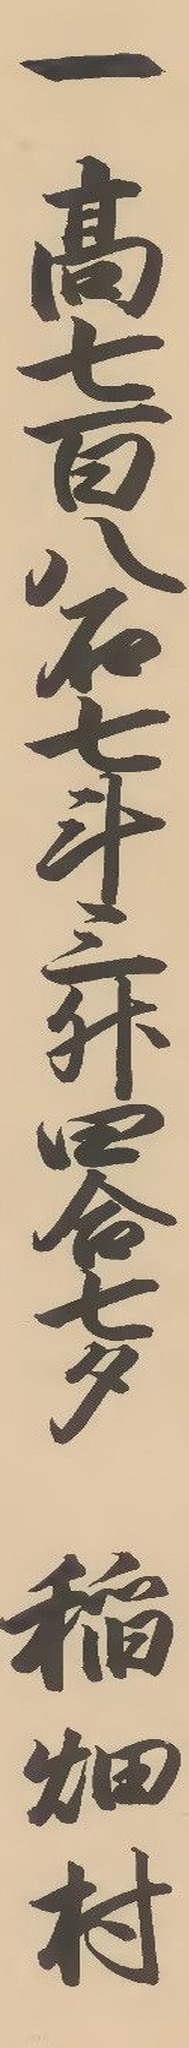一高七百八石七斗三升四合七勺稲畑村
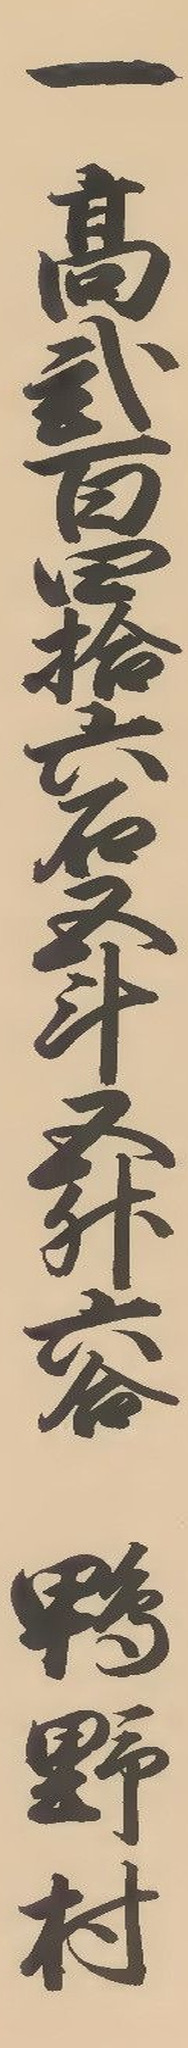一高弐百四拾六石五斗五升六合鴨野村
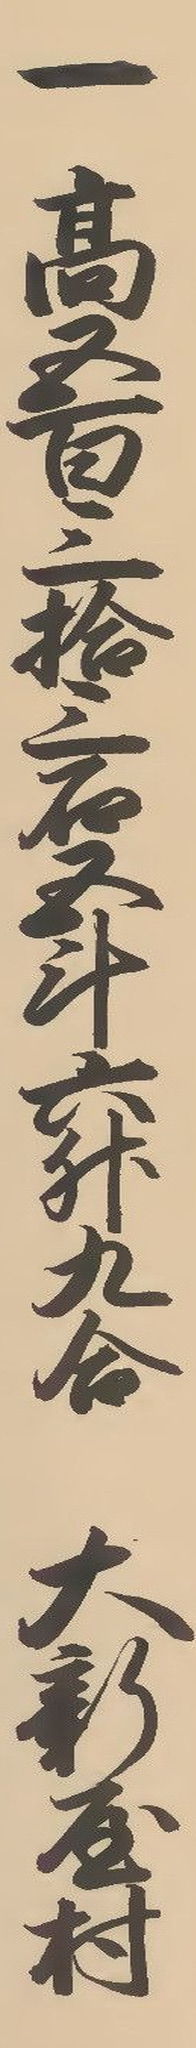一高五百三拾三石五斗六升九合大新屋村
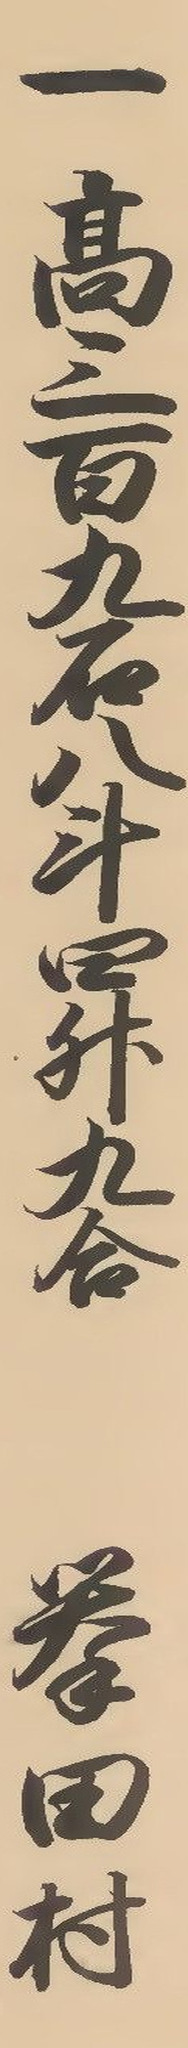一高三百九石八斗四升九合岸田村
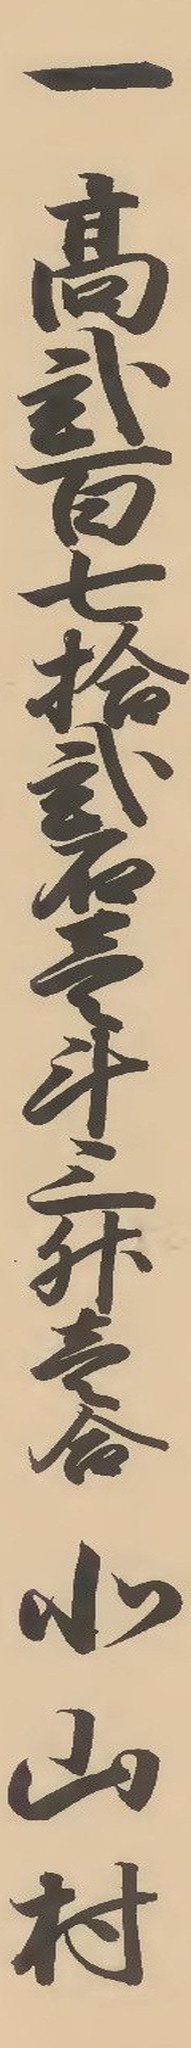一高弐百七拾弐石壱斗三升壱合北山村
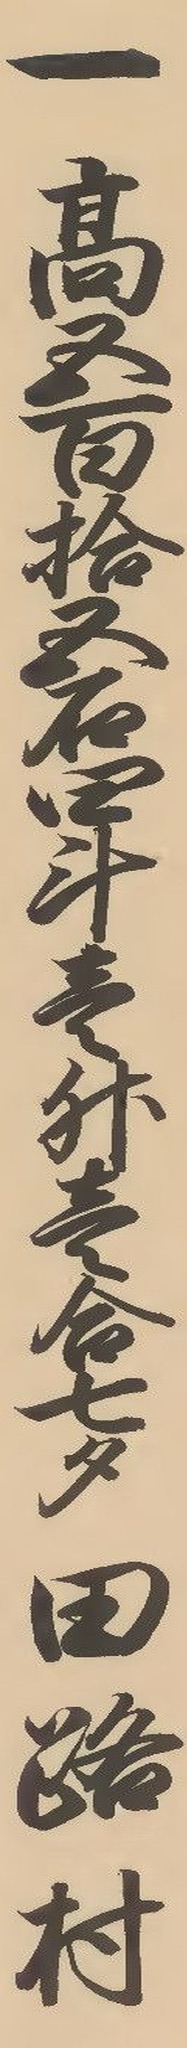一高五百拾五石四斗壱升壱合七勺田路村
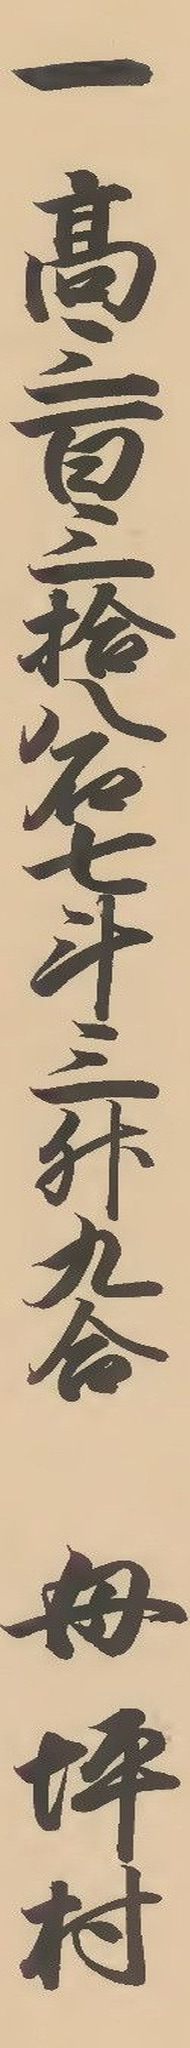一高三百三拾八石七斗三升九合母坪村

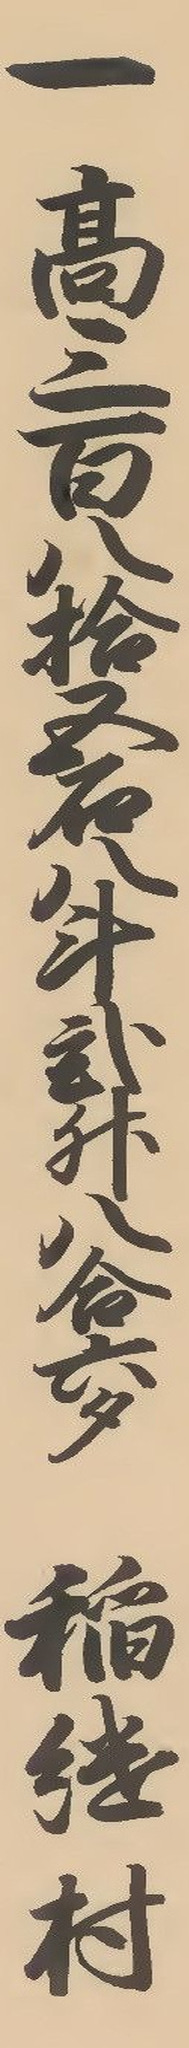一高三百八拾五石八斗弐升八合六勺稲継村
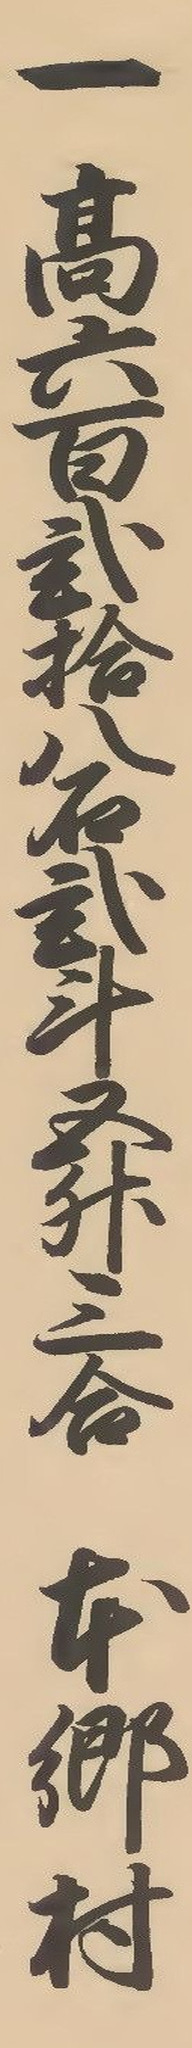一高六百弐拾八石弐斗五升三合本郷村
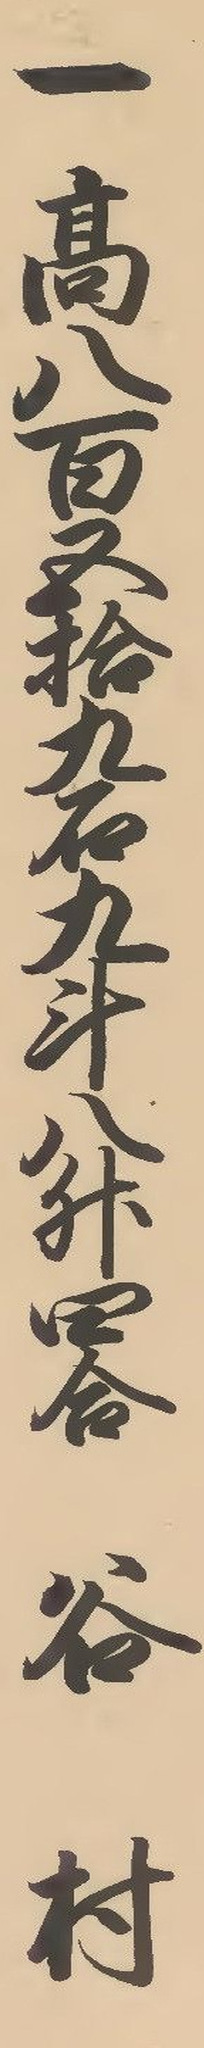一高八百五拾九石九斗八升四合谷村
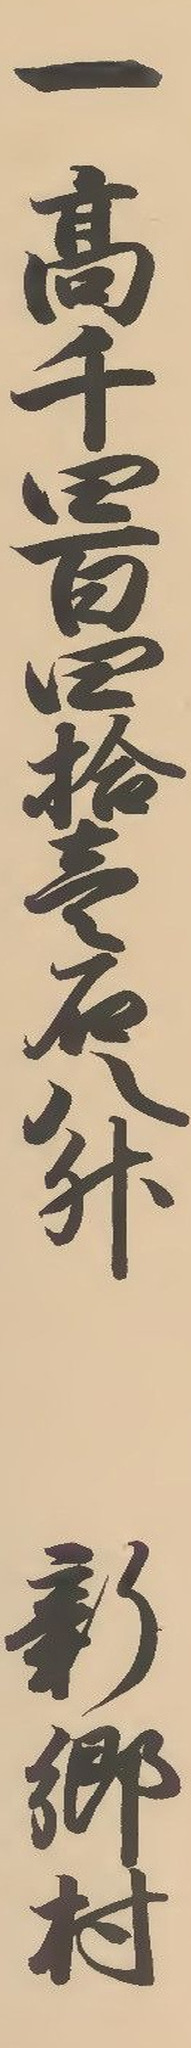一高千四百四拾壱石八升新郷村
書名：丹波国郷帳
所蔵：国立公文書館 National Archives of Japan
